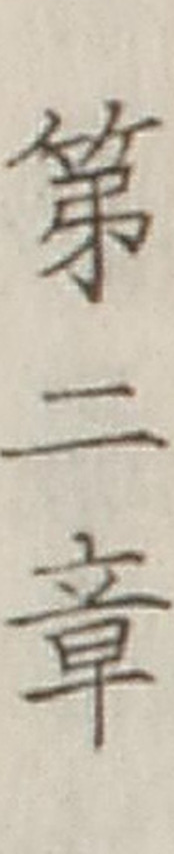第二章
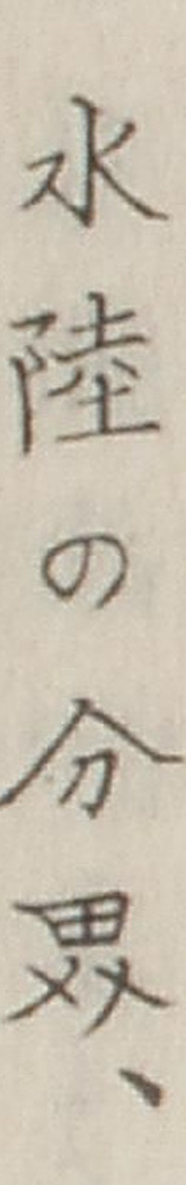水陸の分界、

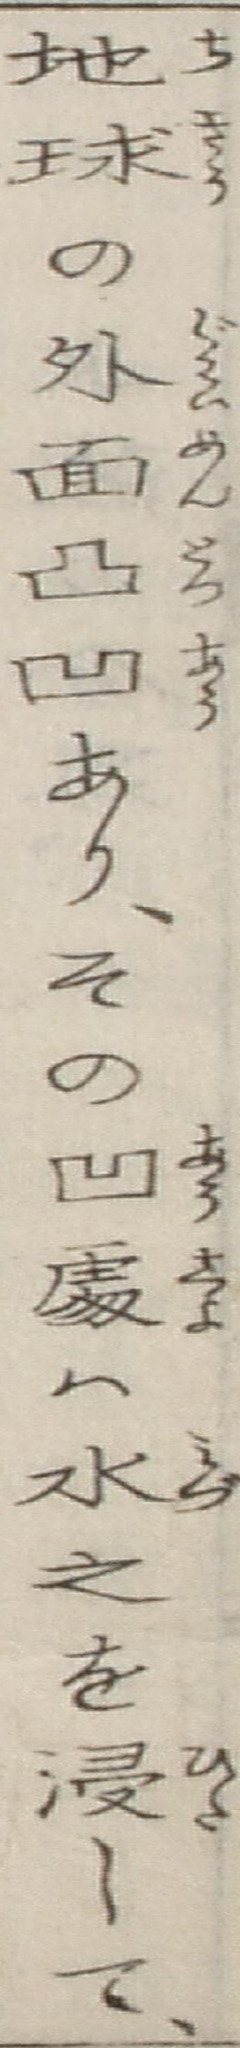地球の外面凸凹あり、その凹処は水之を浸して、
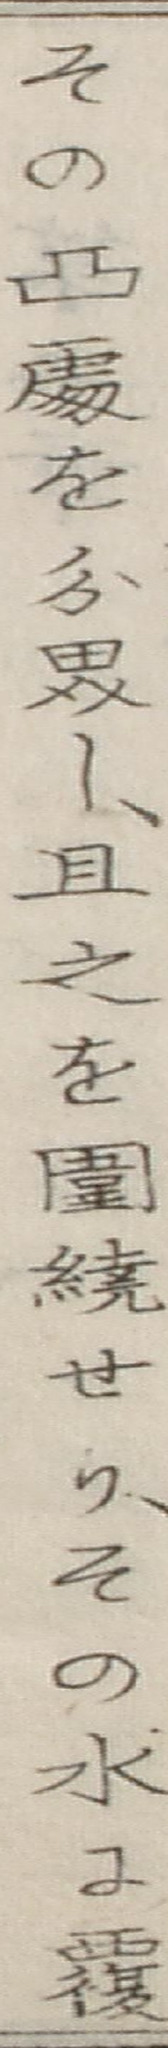その凸処を分界し、且之を囲繞せり、その水に覆
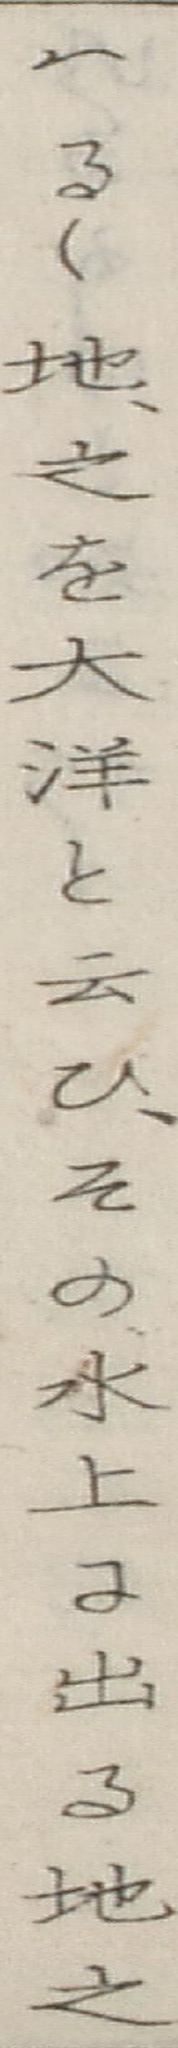はるゝ地、之を大洋と云ひ、その水上に出る地、之
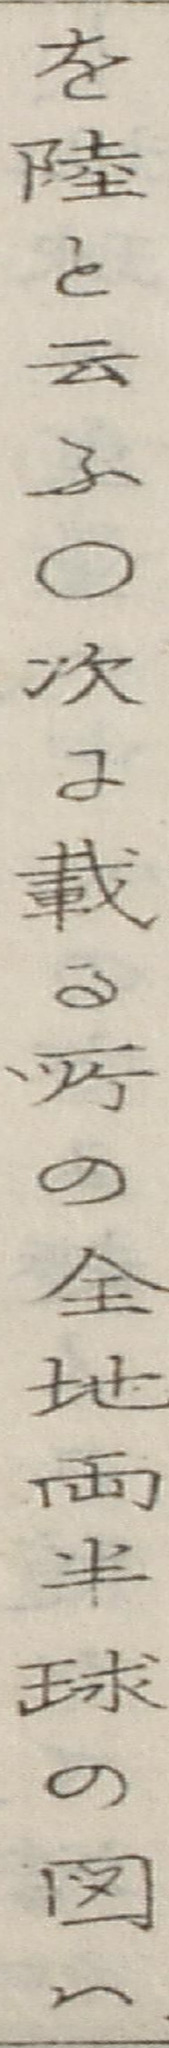を陸と云ふ◯次に載る所の全地両半球の図は、
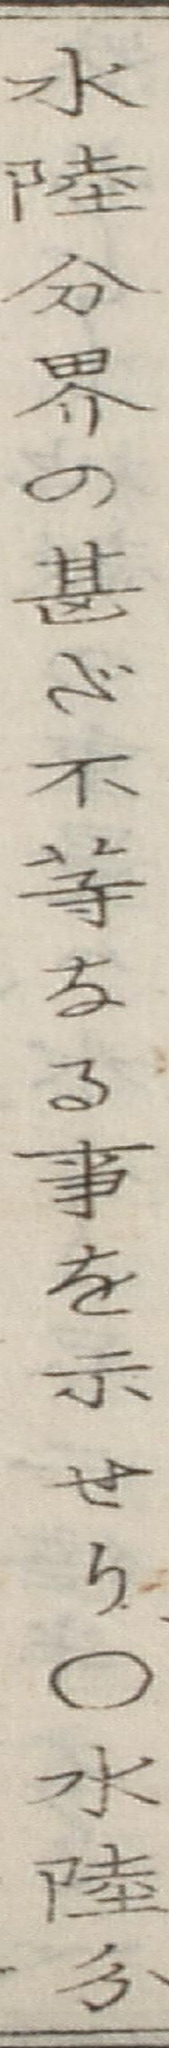水陸分界の甚だ不等なる事を示せり、◯水陸分
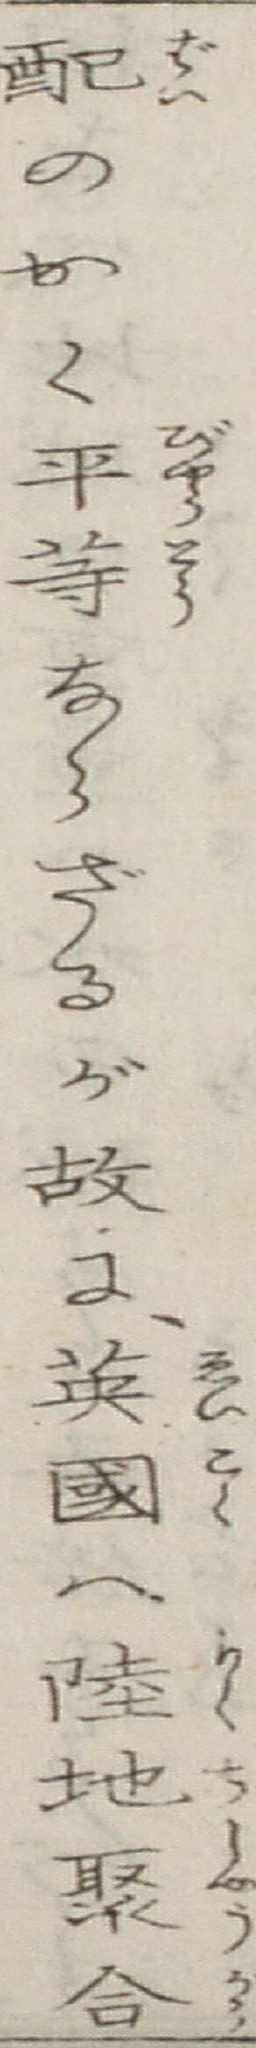配のかく平等ならざるが故に、英国は陸地聚合
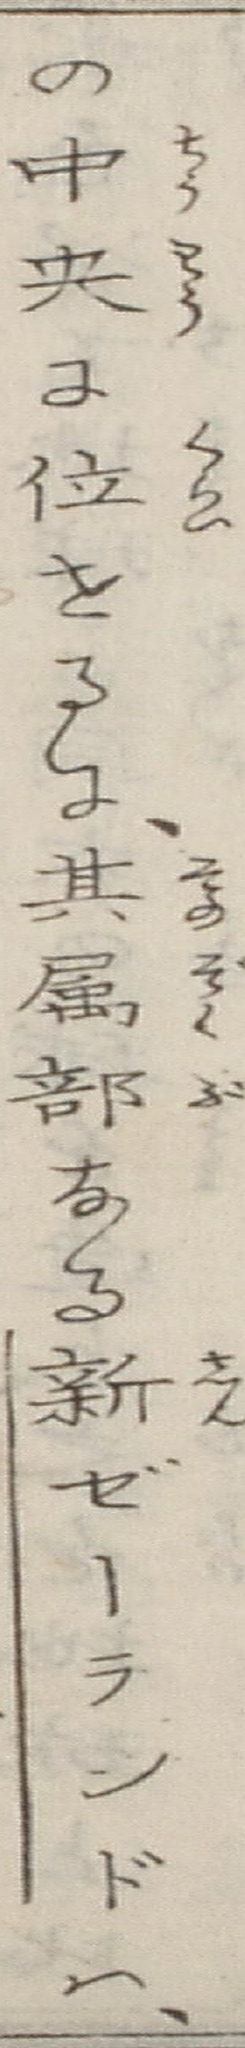の中央に位せるに、其属部なる新ゼーランドは、
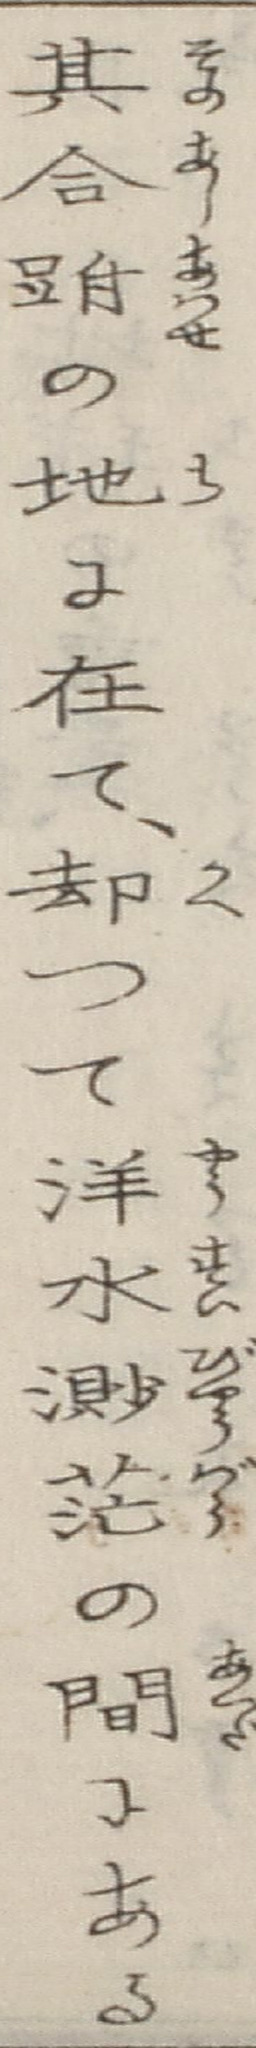其合跗の地に在て、却つて洋水渺茫の間にある
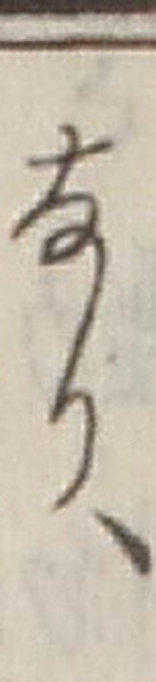なり、

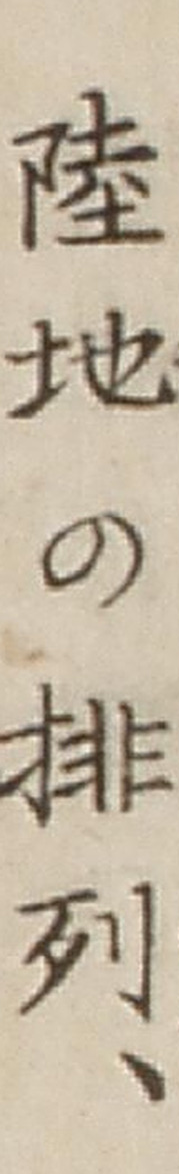陸地の排列、
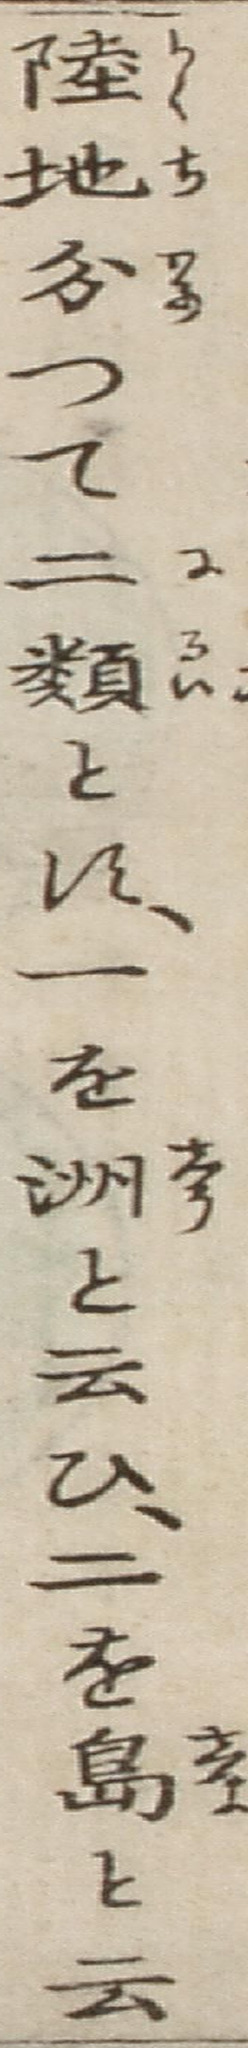陸地分つて二類とす、一を洲と云ひ、二を島と云
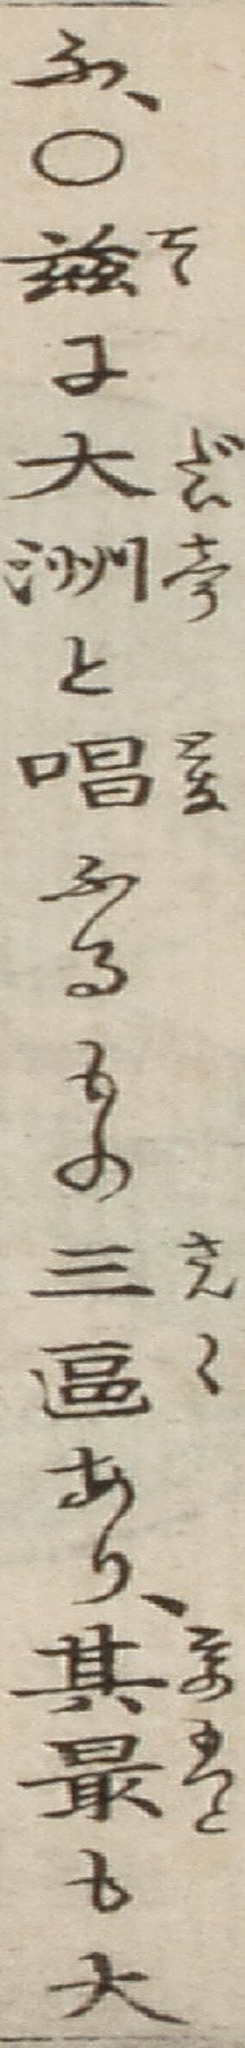ふ、〇茲に大洲と唱ふるもの三区あり、其最も大
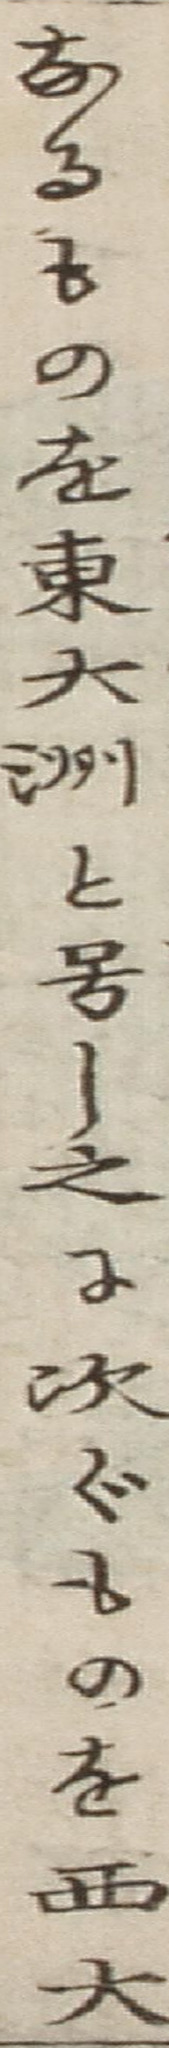なるものを東大洲と号し之に次ぐものを西大
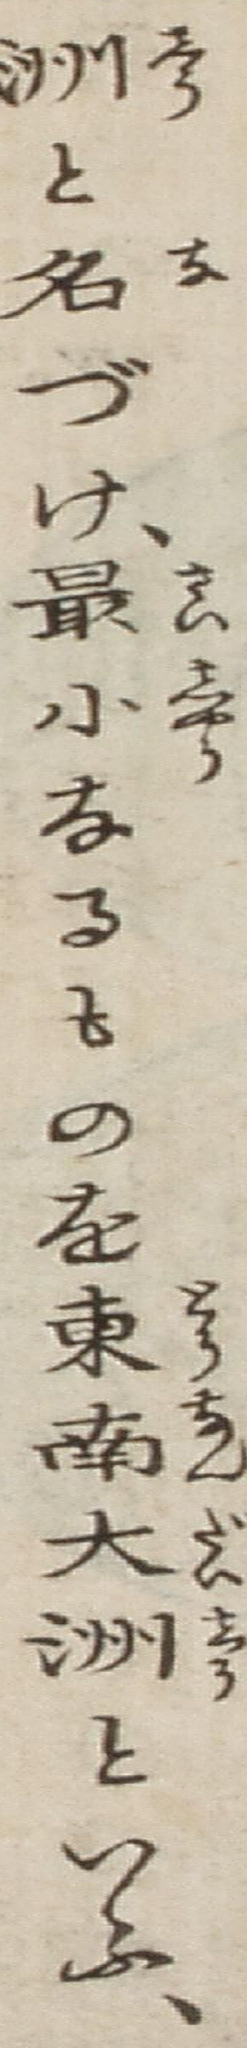洲と名づけ、最小なるものを東南大洲といふ、
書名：訓蒙　天然地理學　上
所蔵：東京大学地震研究所図書室 Earthquake Research Institute Library, The University of Tokyo, JAPAN
